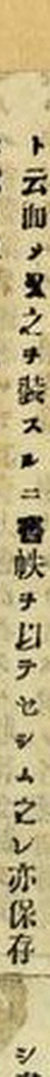ト云而シテ又之ヲ装スルニ書帙ヲ以テセシム之レ亦保存
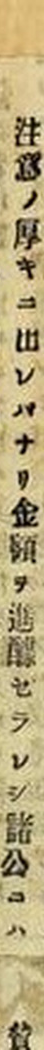注意ノ厚キニ出レバナリ金額進醸セラレシ諸公ニハ
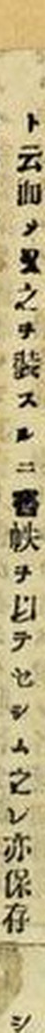ト云而シテ又之ヲ装スルニ書帙ヲ以テセシム之レ亦保存
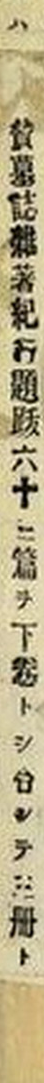賛墓誌雜著紀行題跋六十二篇ヲ下巻トシ合シテ三册ト
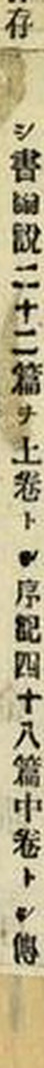シ書論説二十二篇ヲ上巻トシ序記四十八篇中巻トシ傳
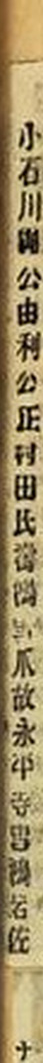小石川親公由利公正村田氏當鴻雪爪故永平寺雪鴻岩佐
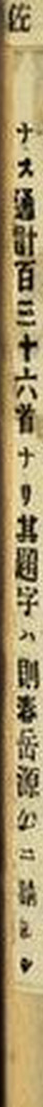ナス通計百三十六首ナリ其題字ハ則春岳源公ニ請シテ
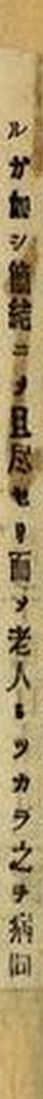ルが如シ箇結ニシテ且尽セリ而シテ老人ミツカラ之ヲ病同
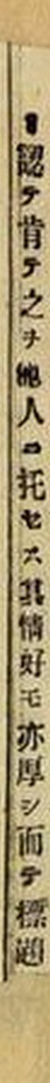ヲ認テ肯テ之ヲ他人ニ托セス其情好モ亦厚シ而テ標題
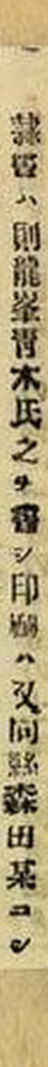隷書ハ則龍峯青木氏之ヲ書シ印刷ハ又同縣森田某ニシ
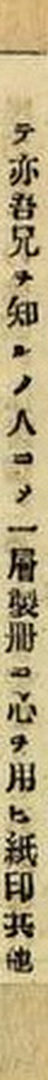テ亦吾兄ヲ知ンノ人ニシテ一層製册ニ心ヲ用ヒ紙印其他
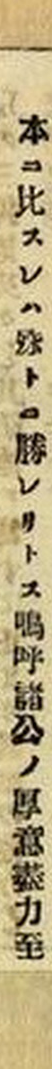本ニ比スレハ殊トニ勝レリトス嗚呼諸公ノ厚意盡力至
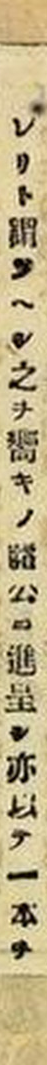レリト謂フヘシ之ヲ嚮キノ諸公ニ進呈シ亦以テ一本ヲ
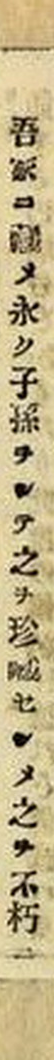吾家ニ藏シテ永ク子孫ヲシテ之ヲ珍藏セシメ之ヲ不朽ニ
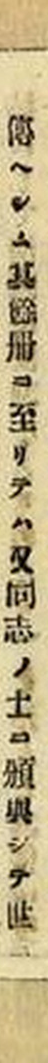傳ヘシム其餘册ニ至リテハ又同志ノ士ニ頒與シテ世ニ
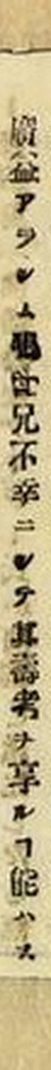廣益アラシム嗚呼兄不幸ニシテ其壽老ヲ享ルヿ能ハス
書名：温古集 四巻
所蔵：福井県文書館 Fukui Prefectural Archives
